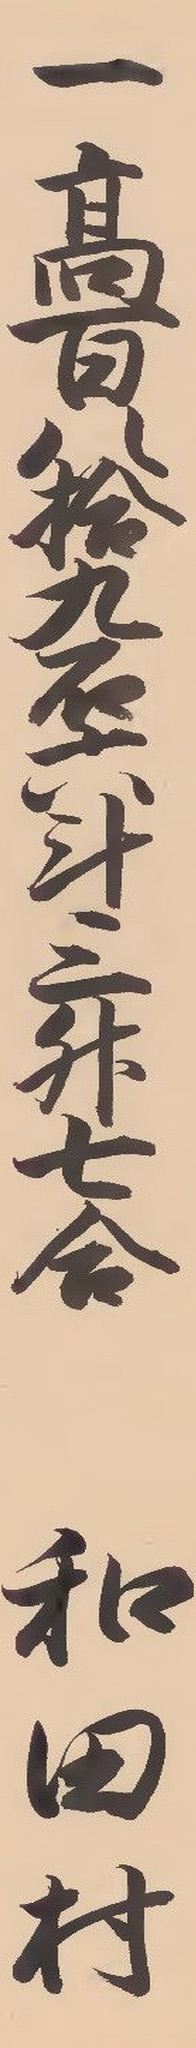一高百八拾九石六斗三升七合和田村
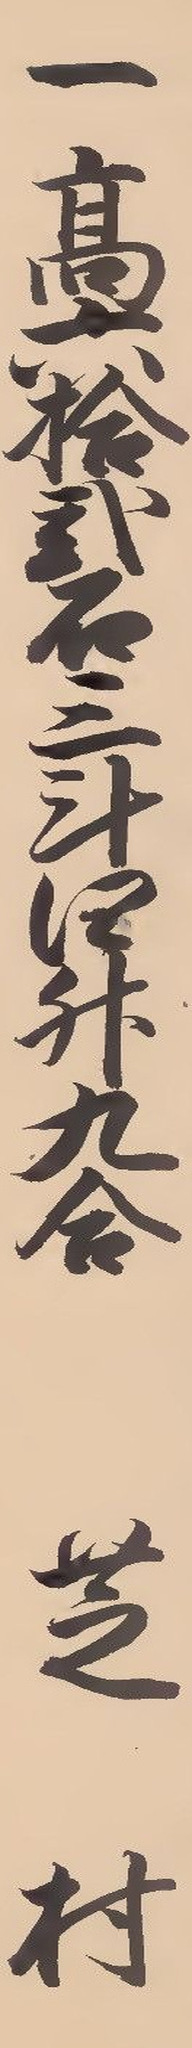一高六拾弐石三斗四升九合芝村
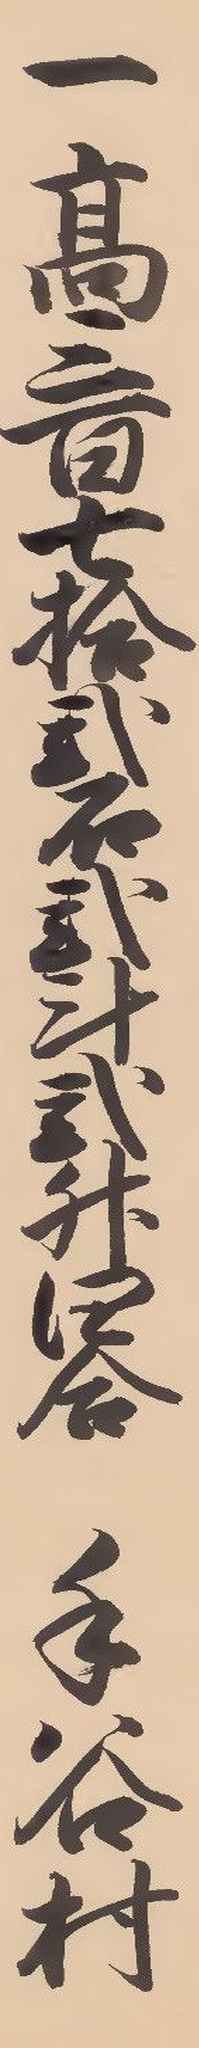一高三百七拾弐石弐斗弐升四合手谷村
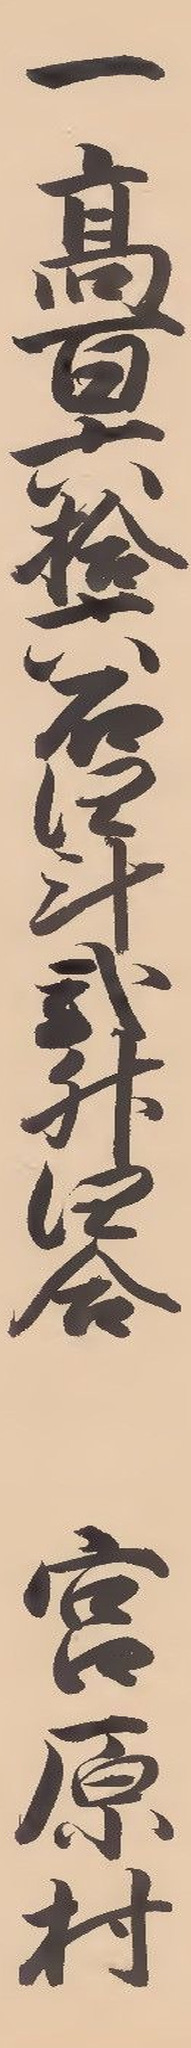一高百六捨六石四斗弐升四合宮原村
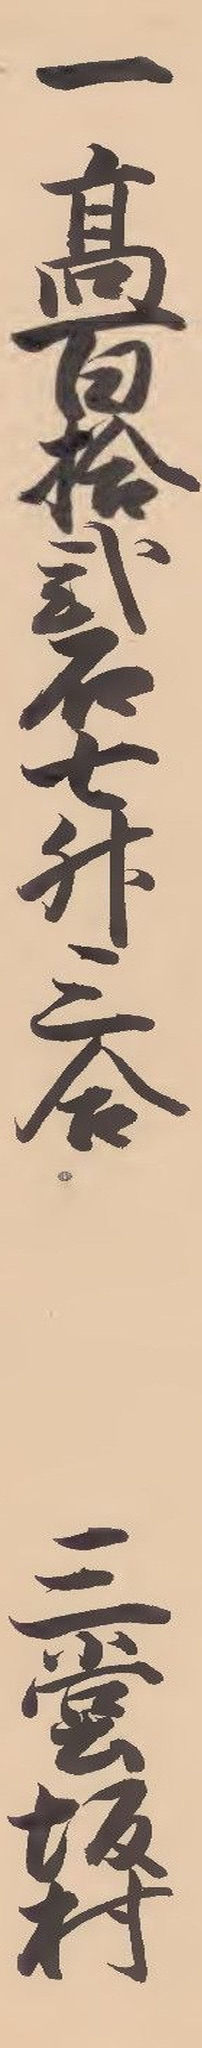一高百拾弐石七升三合三堂坂村

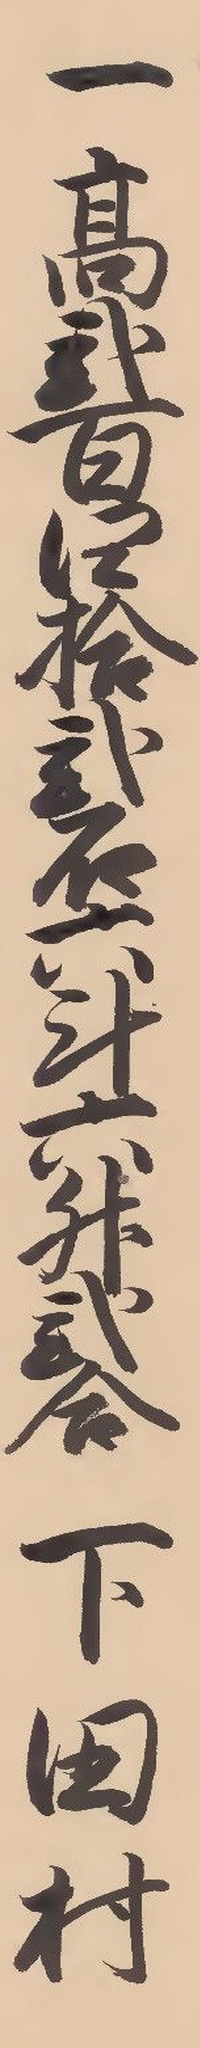一高弐百四拾弐石六斗六升弐合下田村
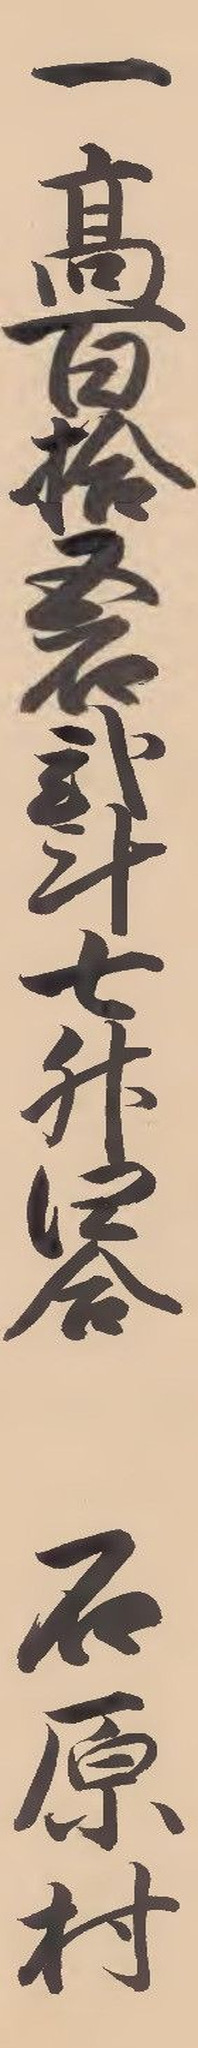一高百拾五石弐斗七升四合石原村
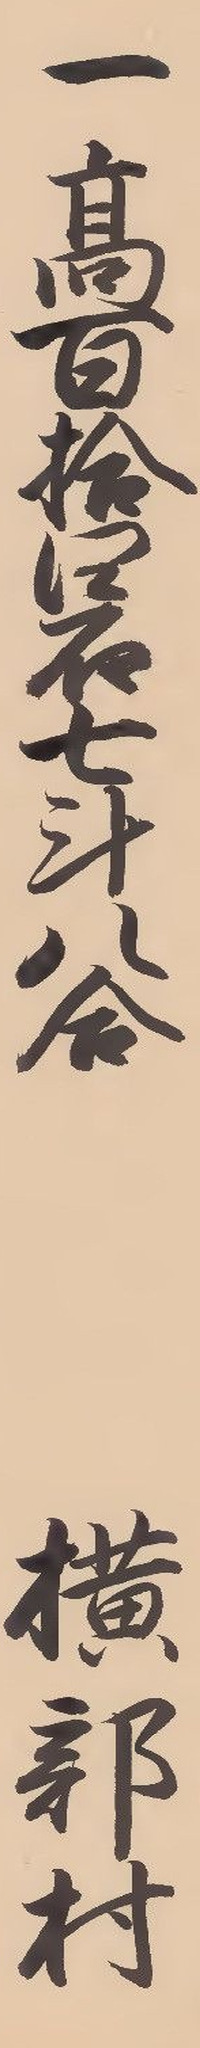一高百拾四石七斗八合横部村
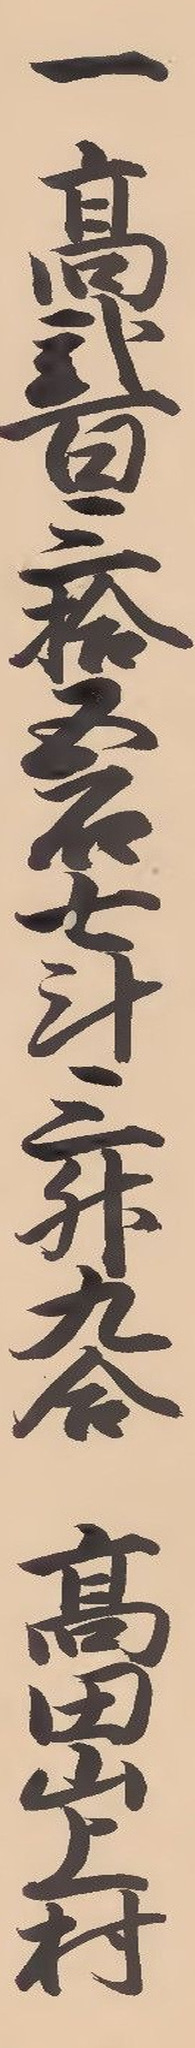一高弐百三拾五石七斗三升九合高田山上村
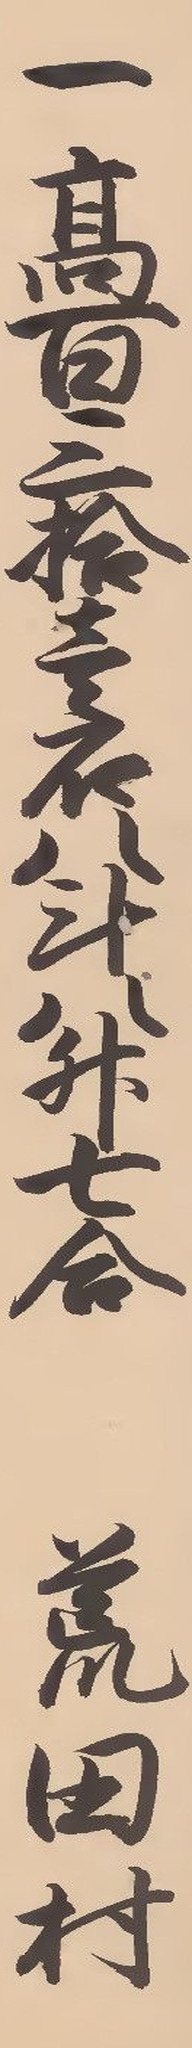一高百三拾壱石八斗八升七合荒田村
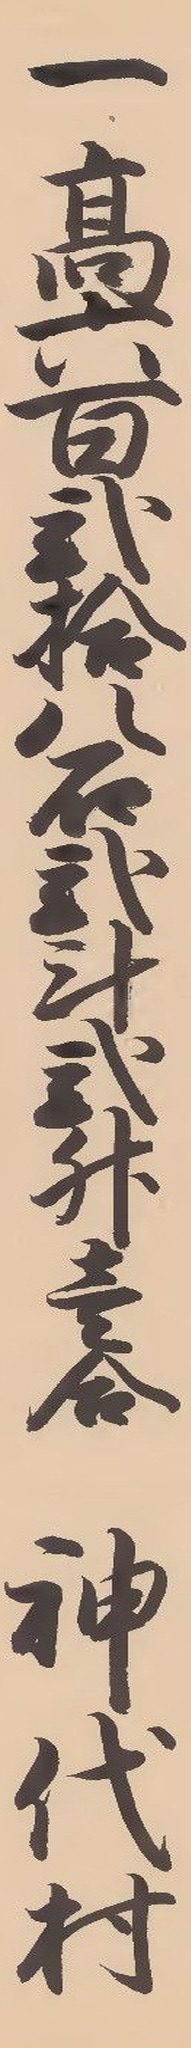一高六百弐拾八石弐斗弐升壱合神代村
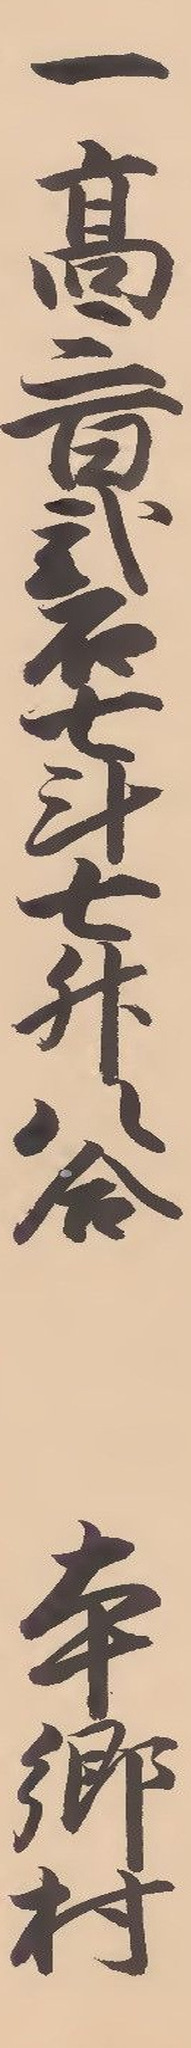一高三百弐石七斗七升八合本郷村

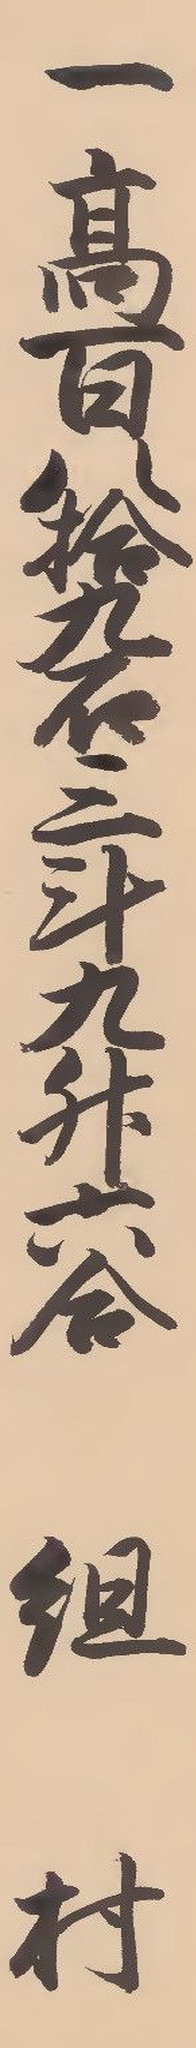一高百八拾九石三斗九升六合組村
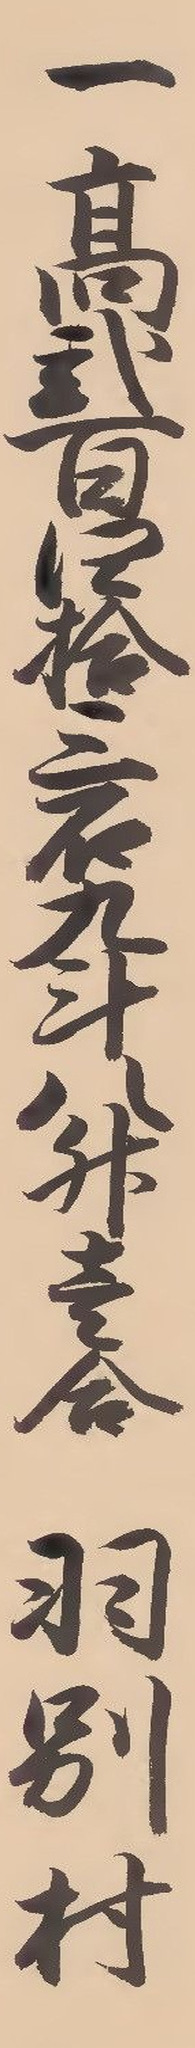一高弐百四拾三石九斗八升壱合羽別村
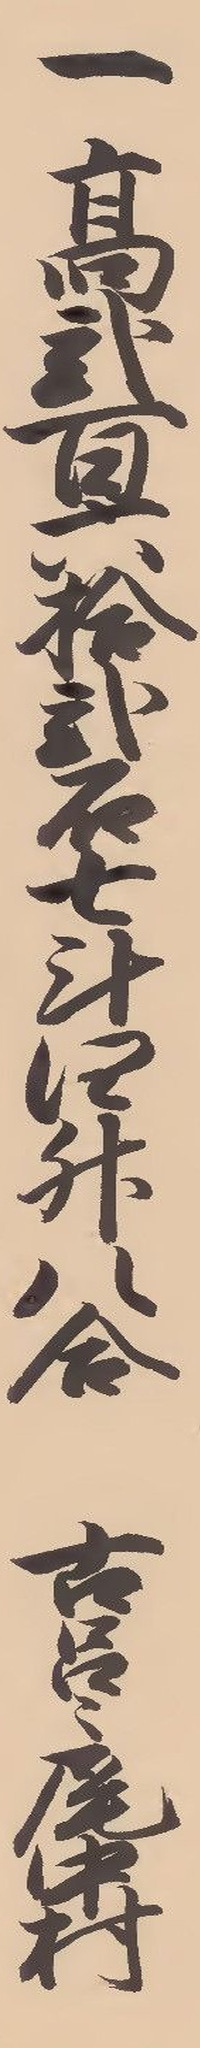一高弐百六拾弐石七斗四升八合古呂々尾中村
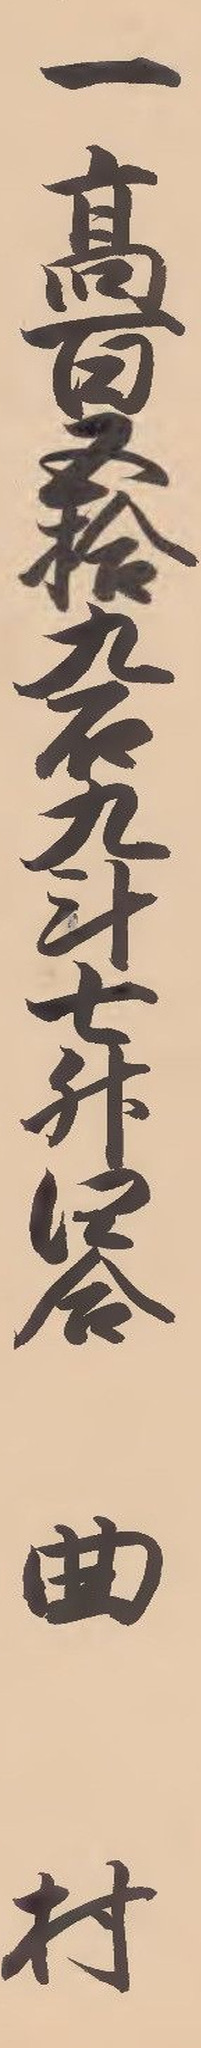一高百五拾九石九斗七升四合曲村
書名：美作国郷帳
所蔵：国立公文書館 National Archives of Japan
